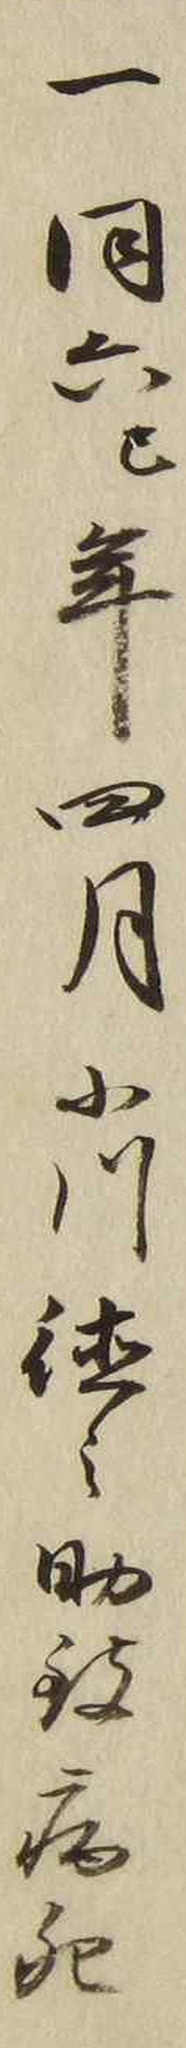一同六巳年四月小川徳之助致病死

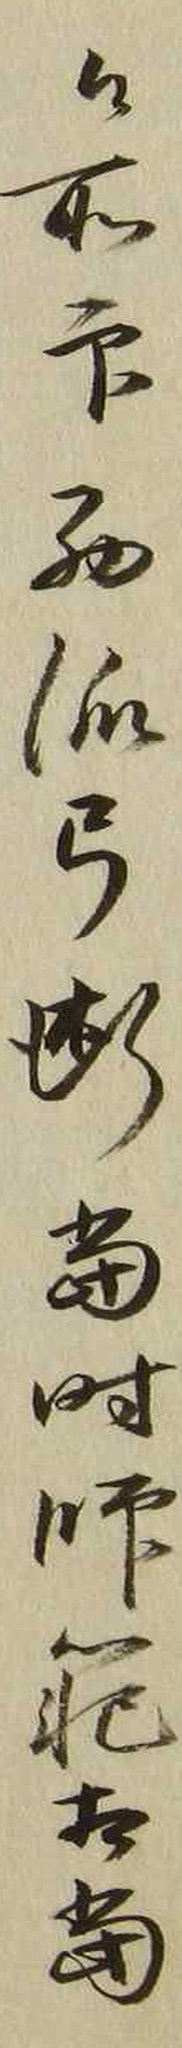候所印西派弓術当時師範相当
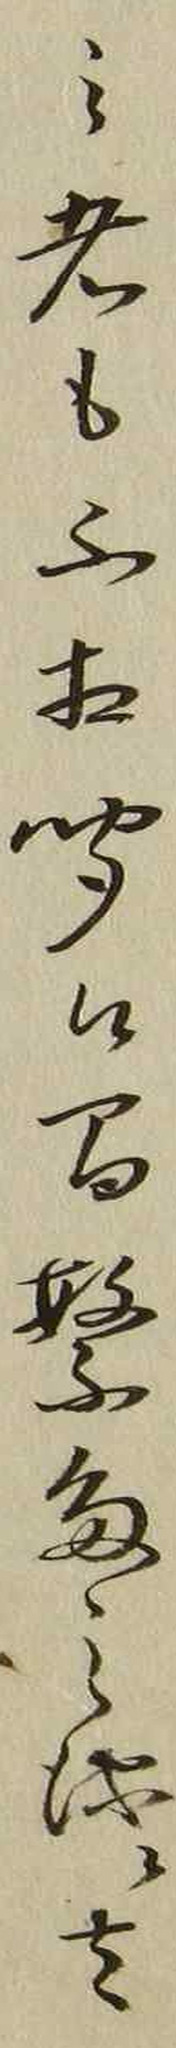之者も不相聞候間繁多之儀ニ者
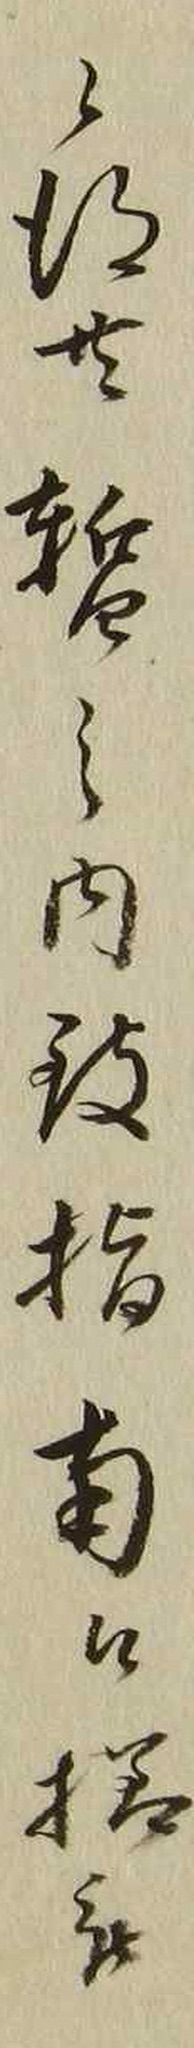候得共暫之内致指南候様被
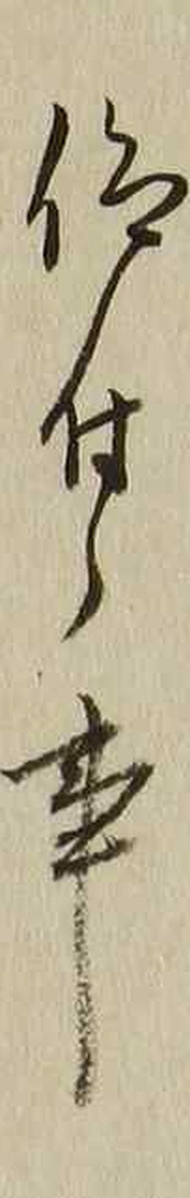仰付候事
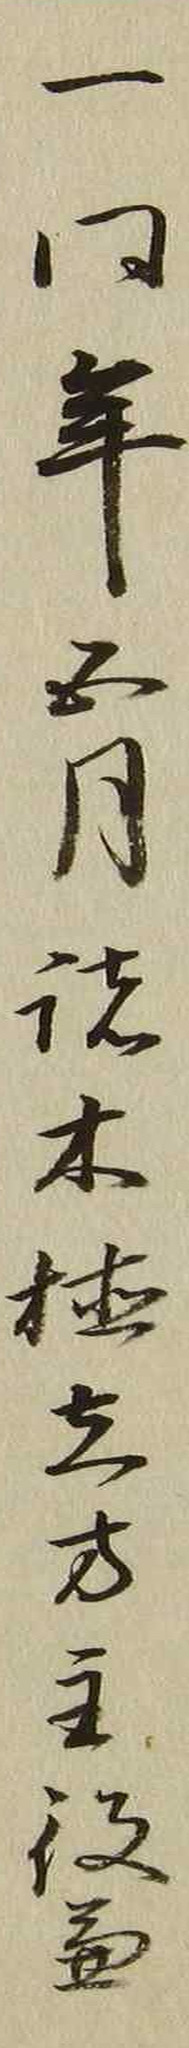一同年五月諸木植立方主役兼
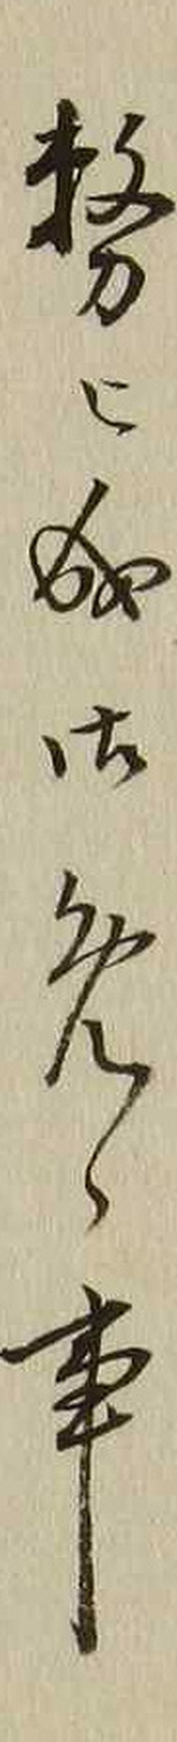務被成御免候事
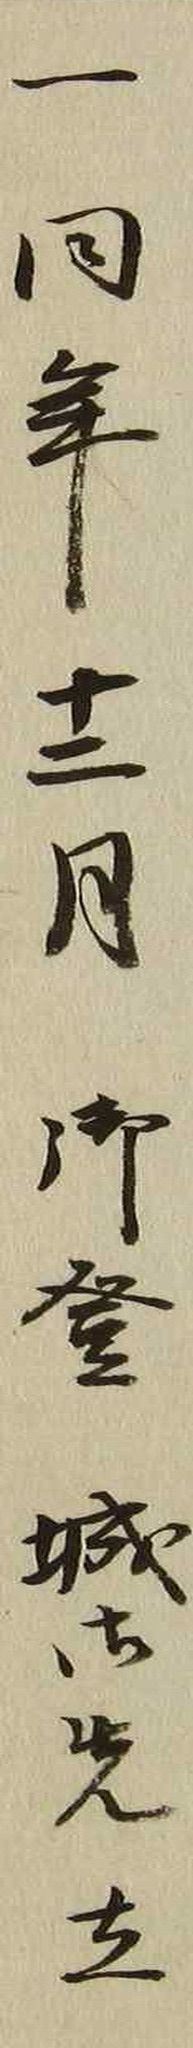一同年十二月御登城御先立
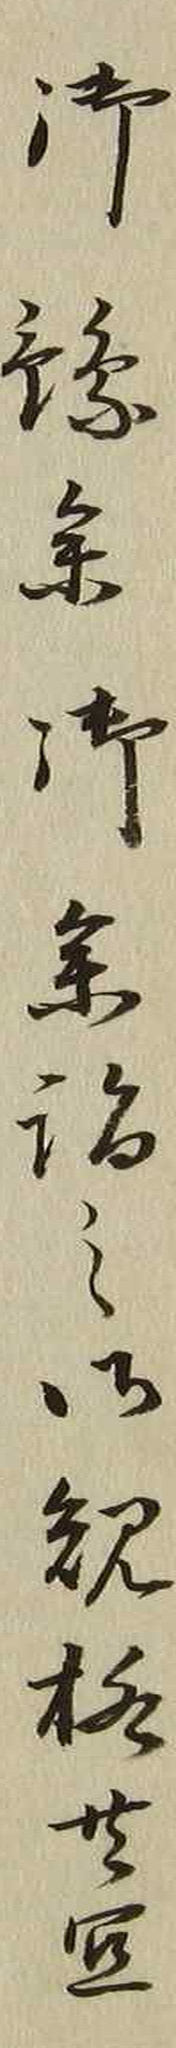御予参御参詣之御規格共宜
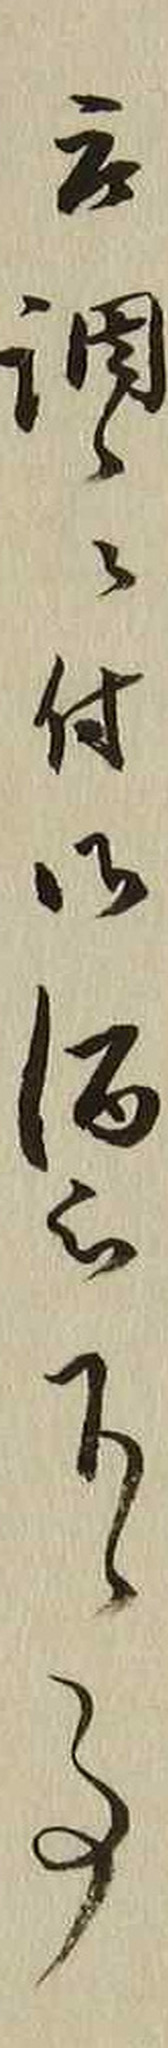取調候ニ付御酒被下候事
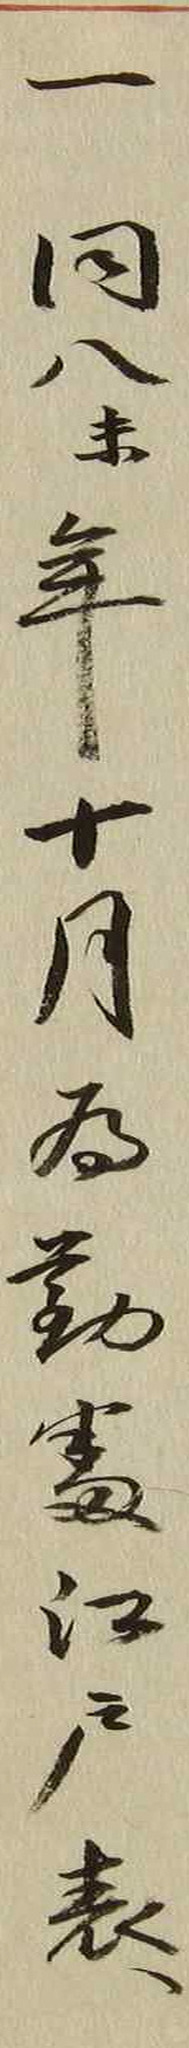一同八未年十月為勤番江戸表へ
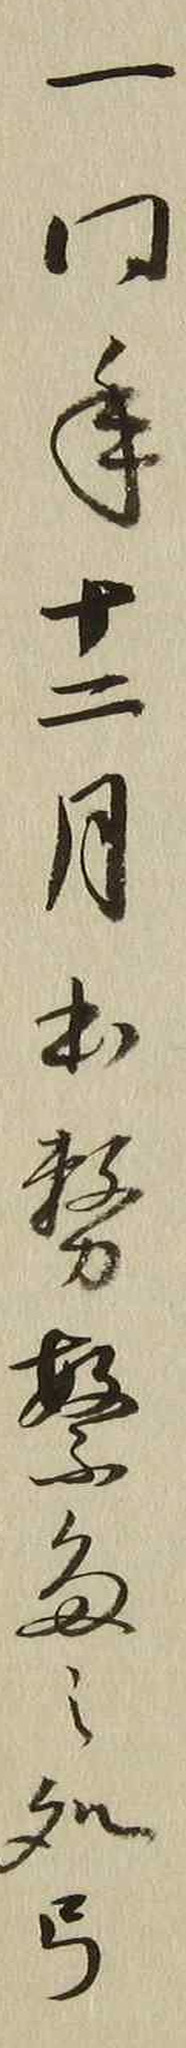一同年十二月本務繁多之処弓
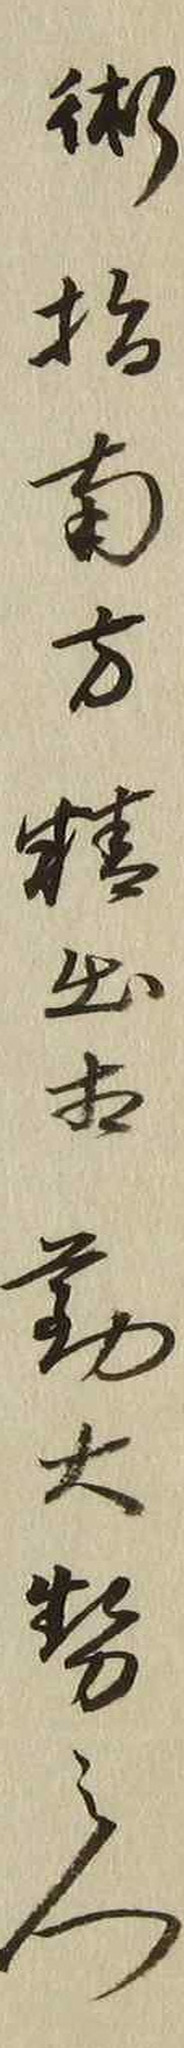術指南方精出相勤大勢之門
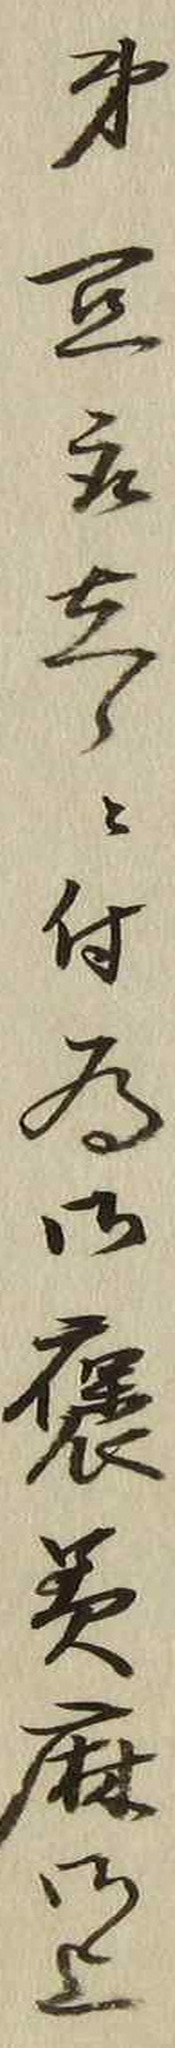弟宜取立候ニ付為御褒美麻御上
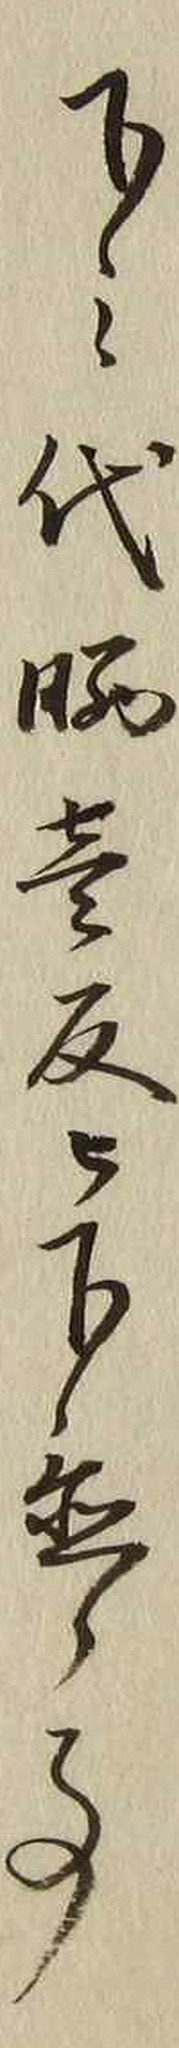下之代晒壱反被下置候事
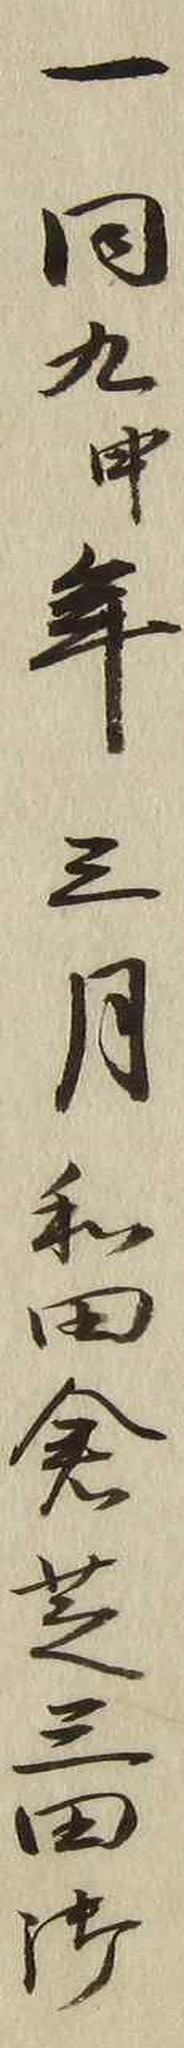一同九申年三月和田倉芝三田御
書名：諸士系譜　巻之69　を之部3
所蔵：会津若松市立会津図書館
